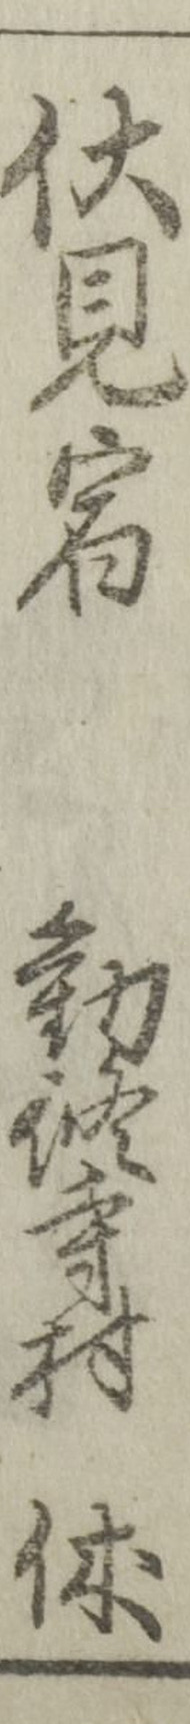伏見宿勧修寺村休
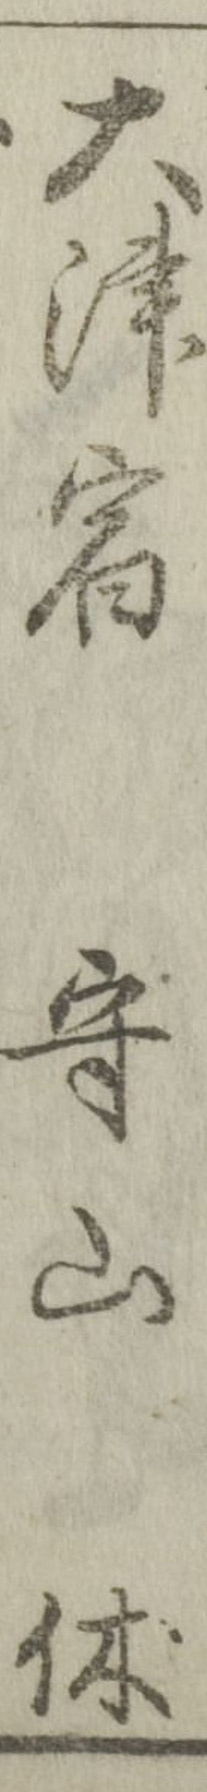大津宿守山休
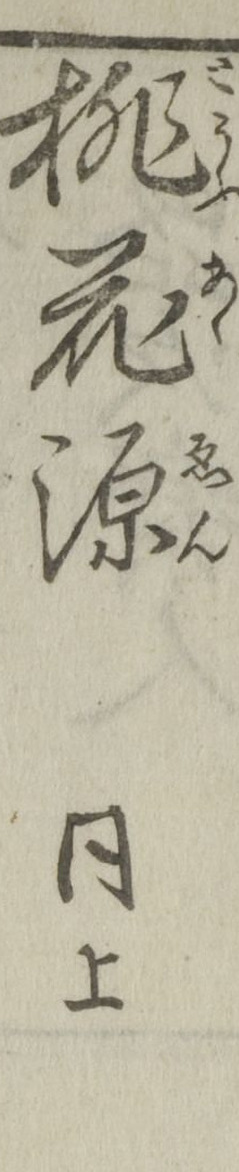桃花源同上
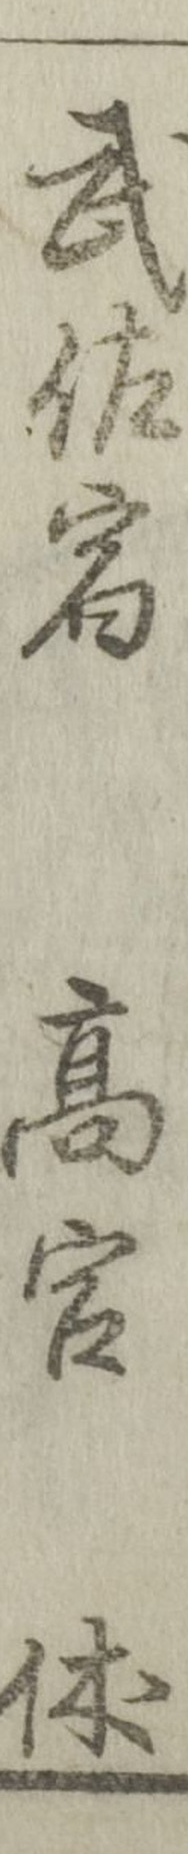武佐宿高宮休
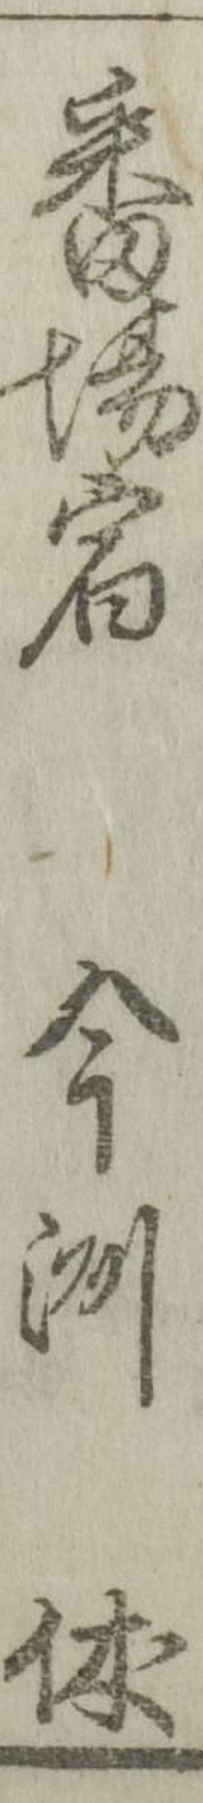番場宿今洲休
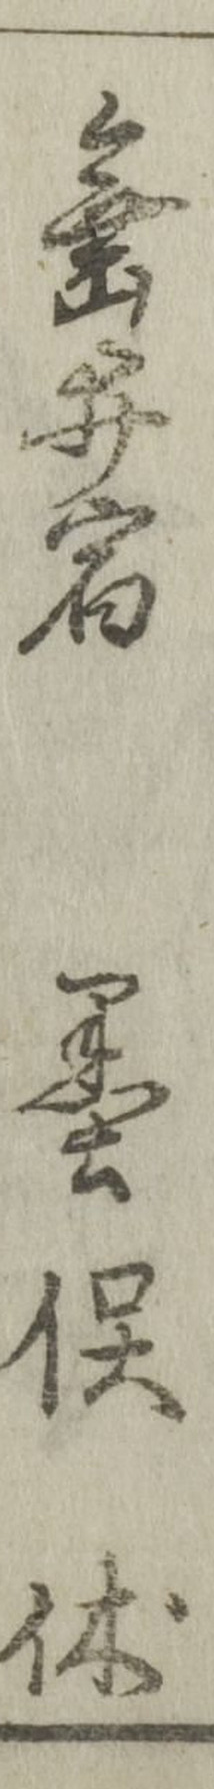垂井宿墨俣休
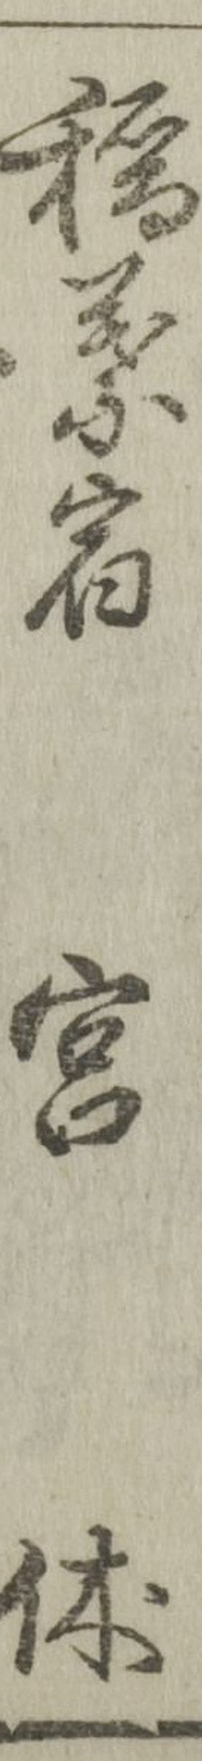稲葉宿宮休
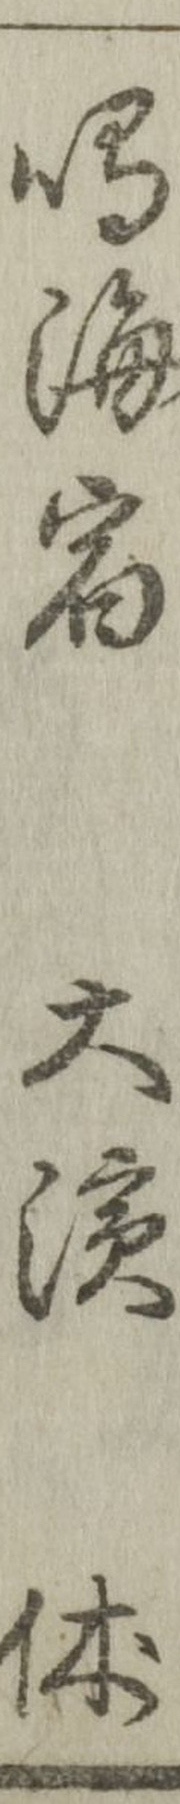鳴海宿大濱休
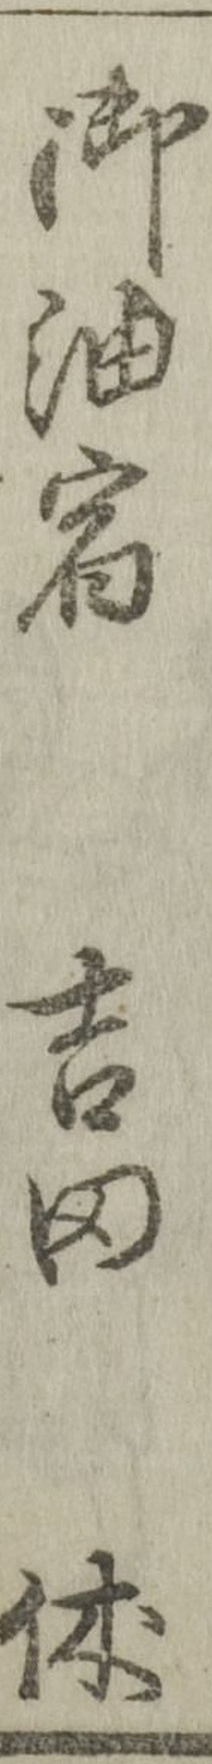御油宿吉田休
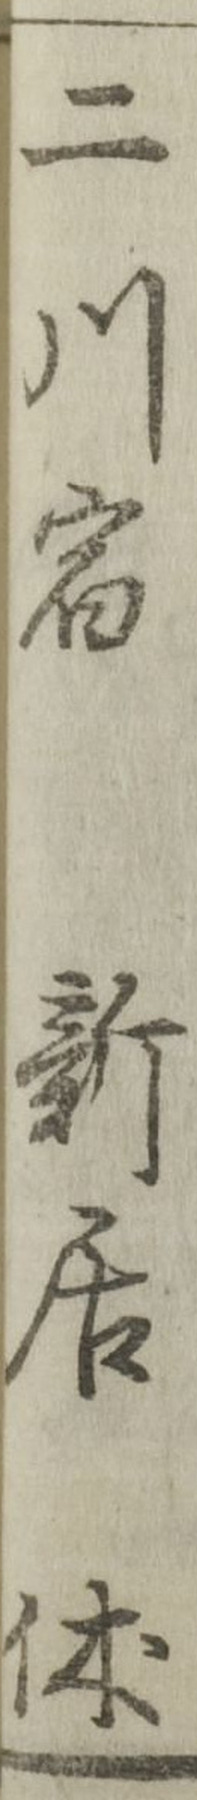二川宿新居休
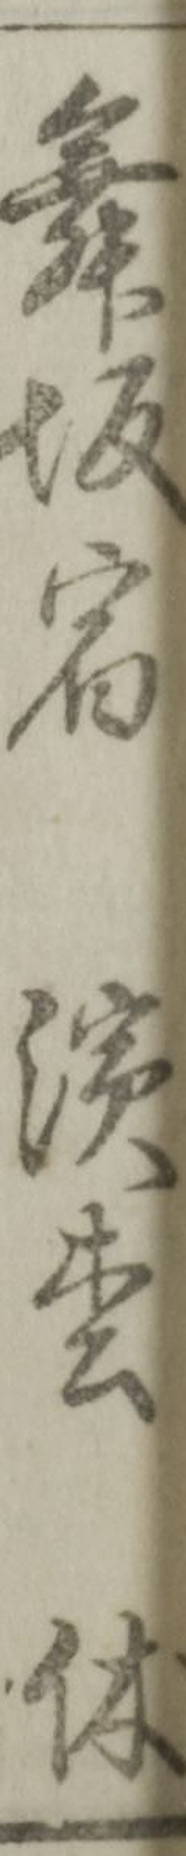舞坂宿濱松休
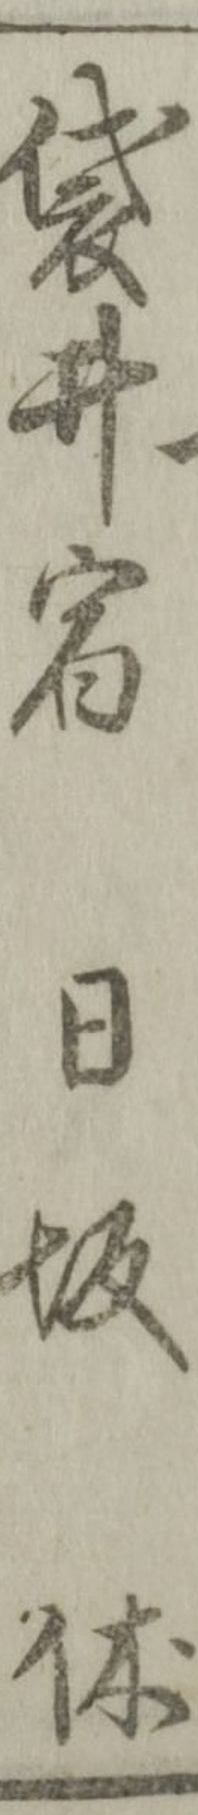袋井宿日坂休
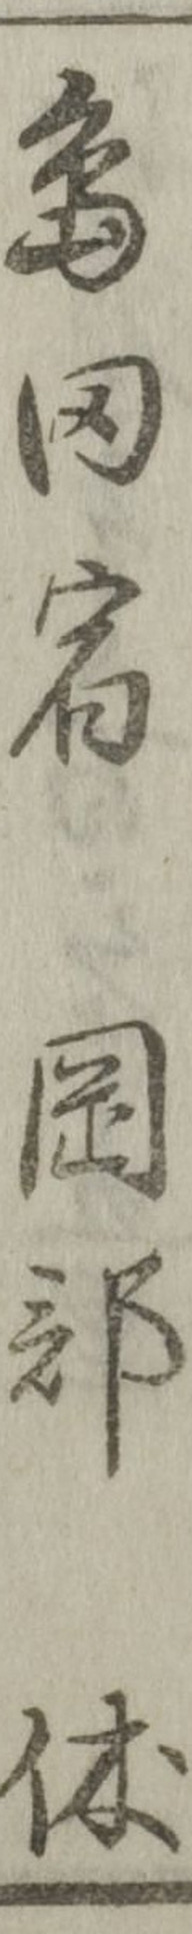島田宿岡部休
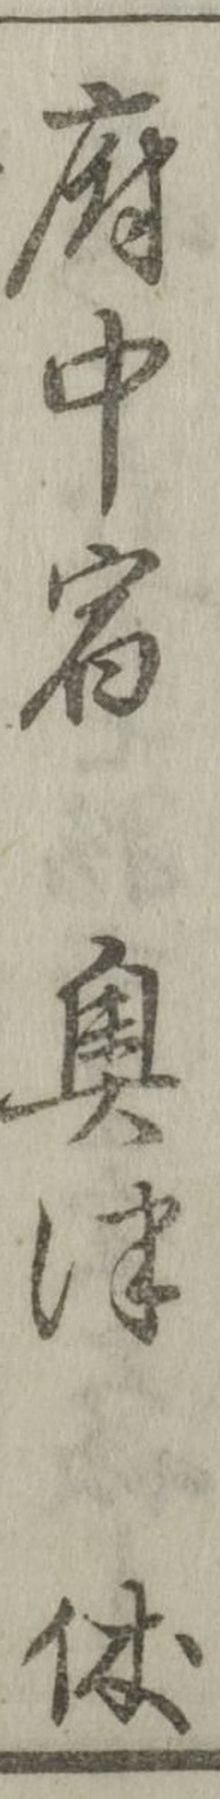府中宿奥津休
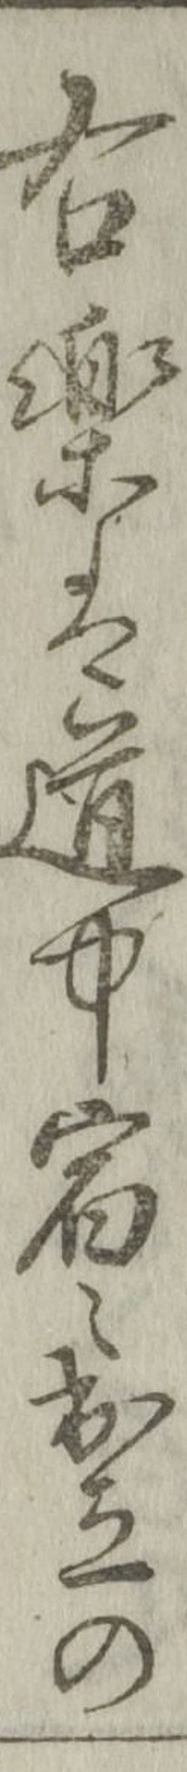右樂は道中宿々出立の
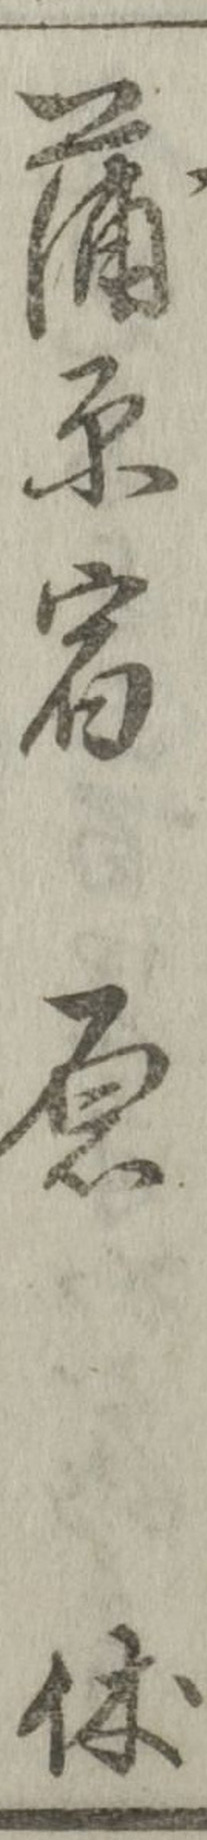蒲原宿原休
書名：琉球人行列記 天保3年
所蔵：University of the Ryukyus Library
